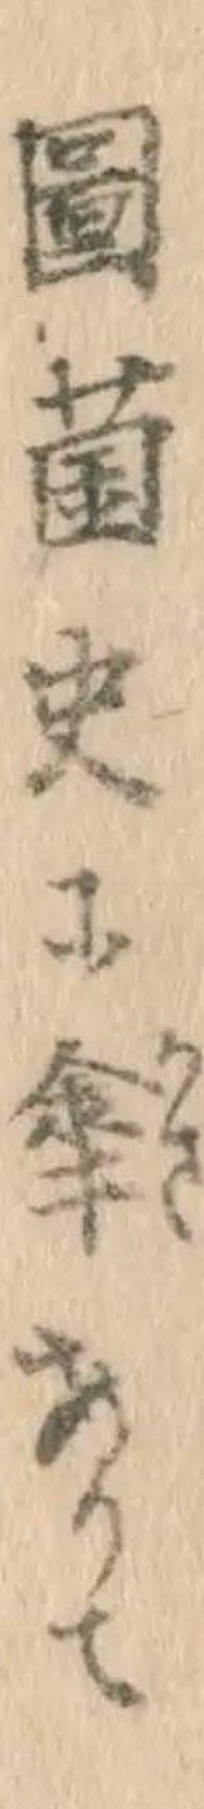図菌史に傘ありて
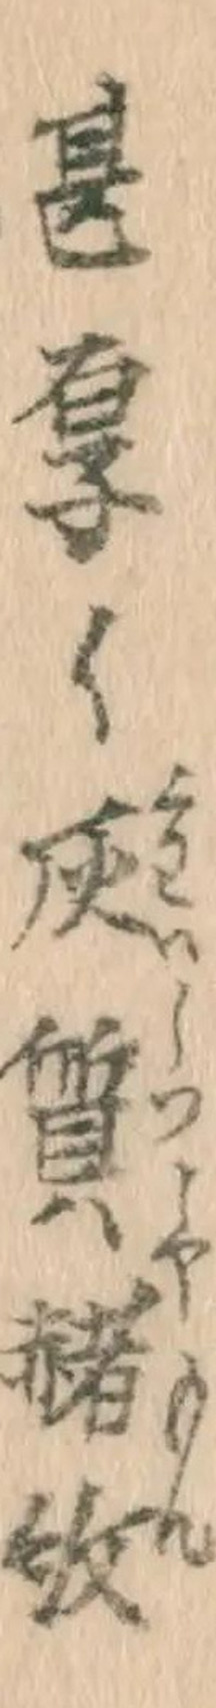甚厚く灰質赭紋
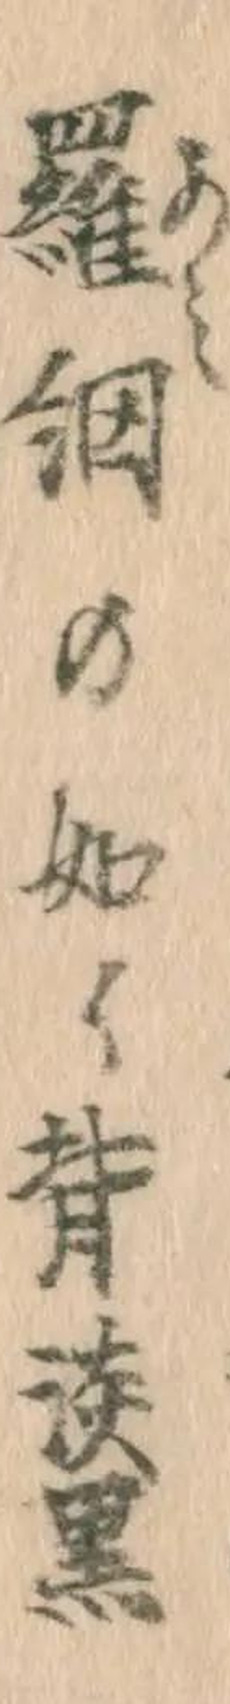羅網の如く背淡黒
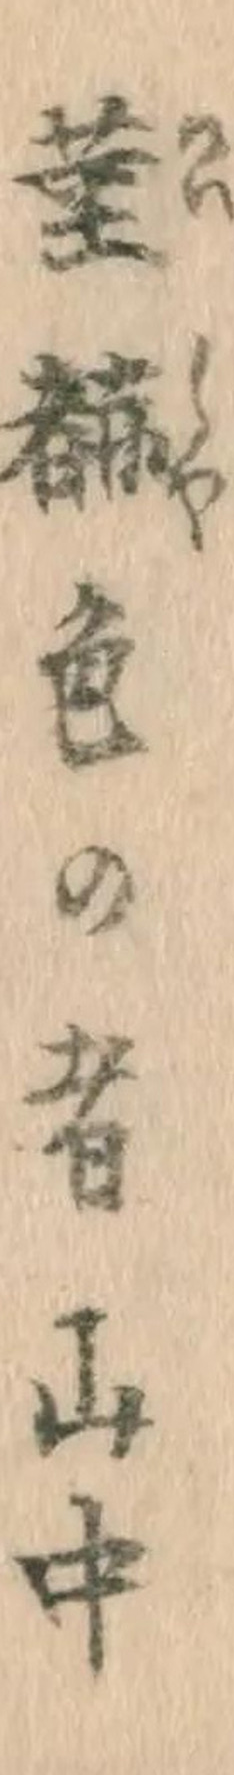茎赭色の者山中
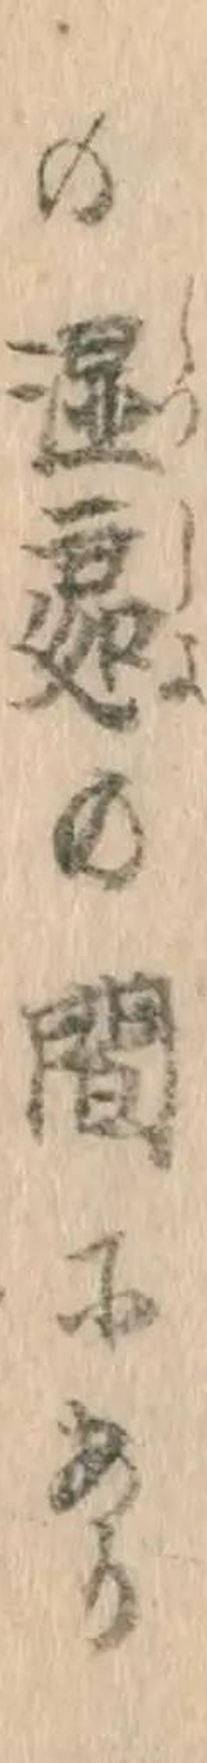の湿処の間にあり
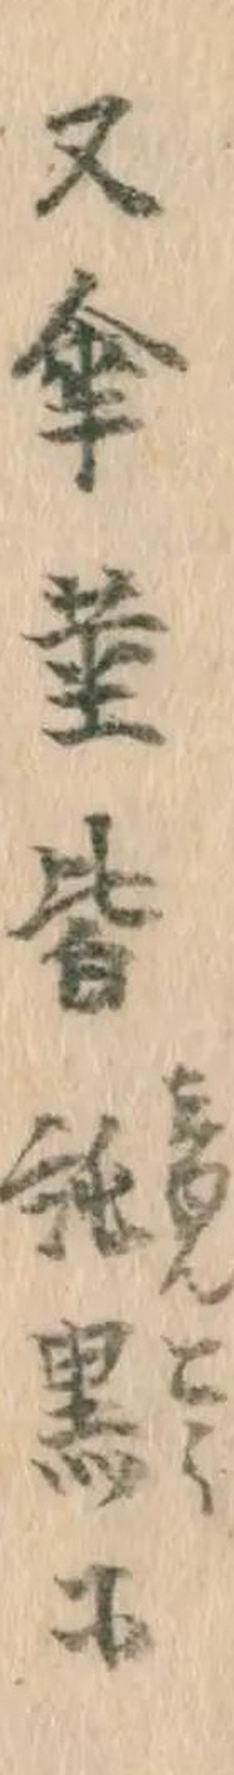又傘茎皆純黒に
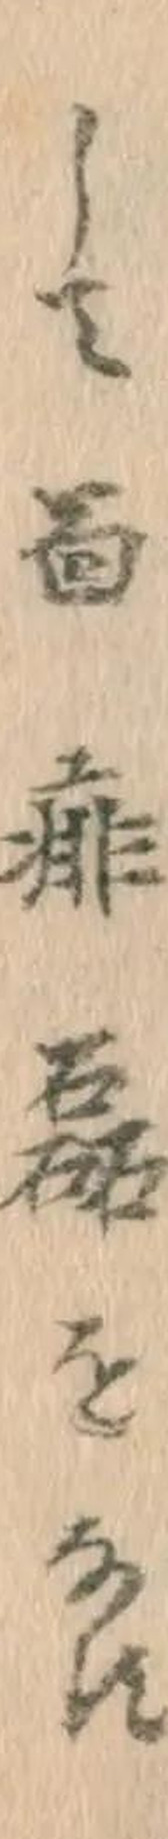して面痱磊をなす
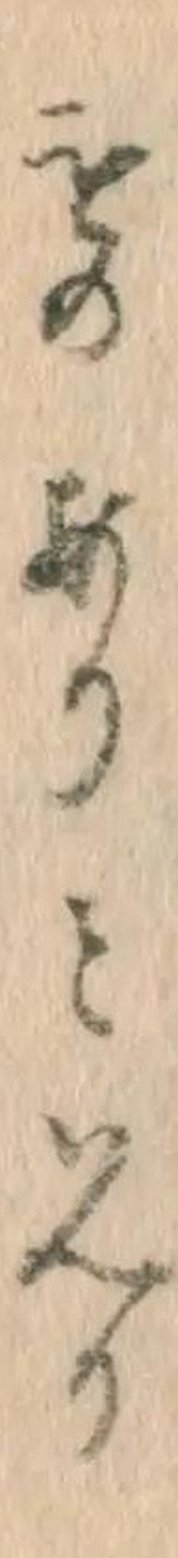ものありといへり
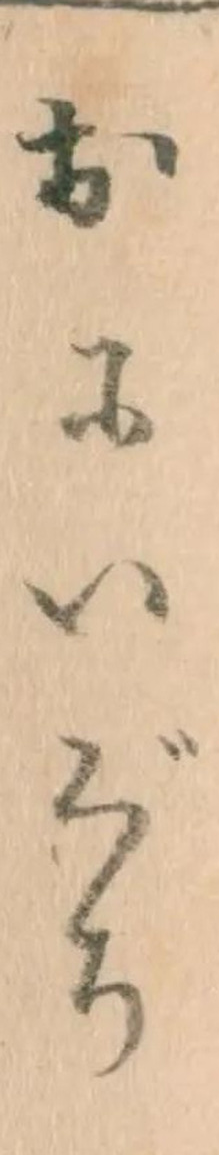おにいぐち
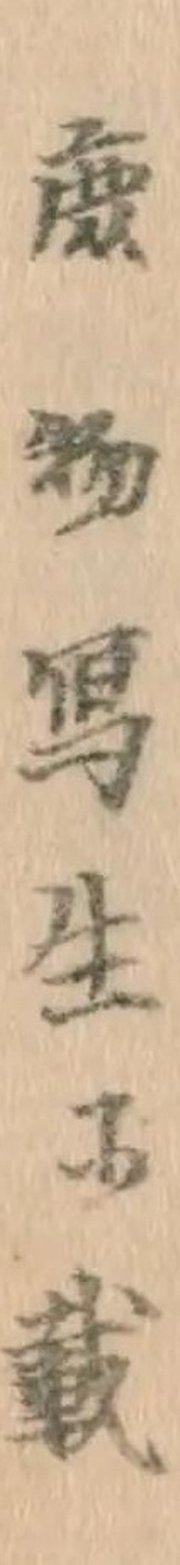庶物写生に載
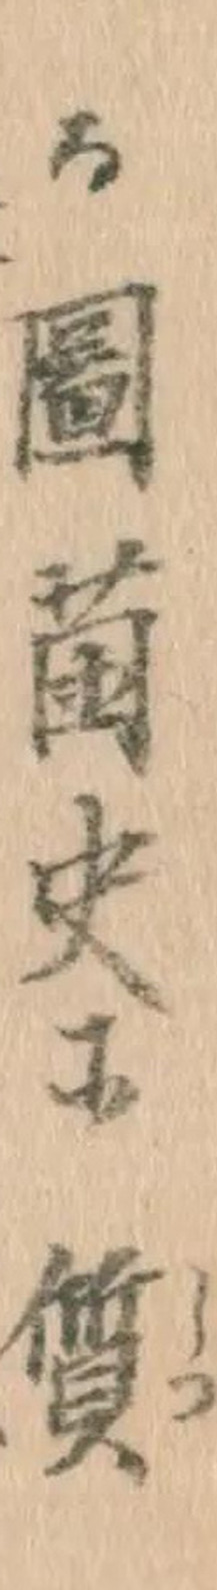る図菌史に質
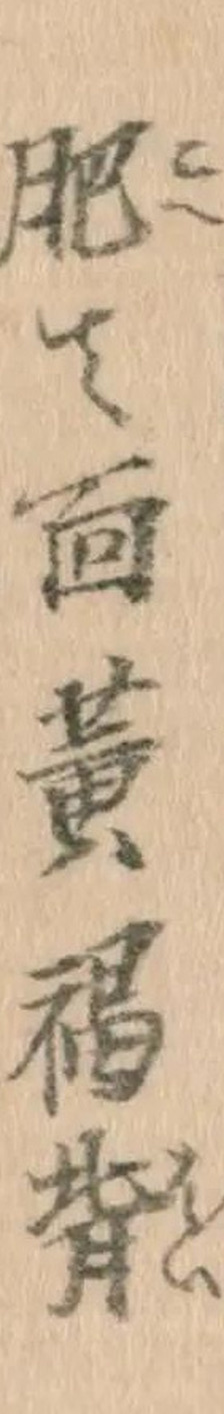肥て面黄褐背
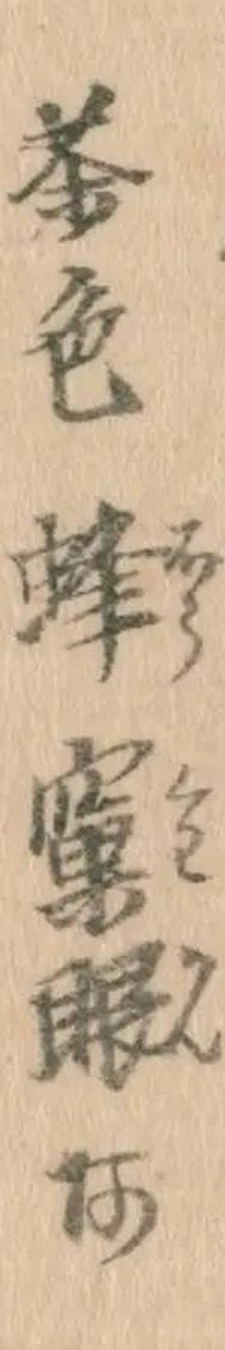茶色蜂窠眼あ
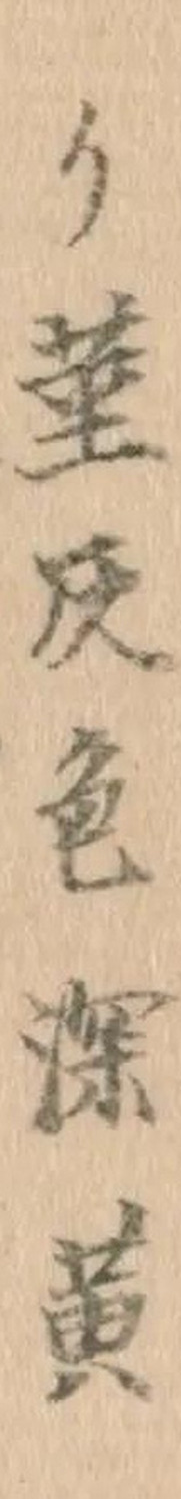り茎灰色深黄
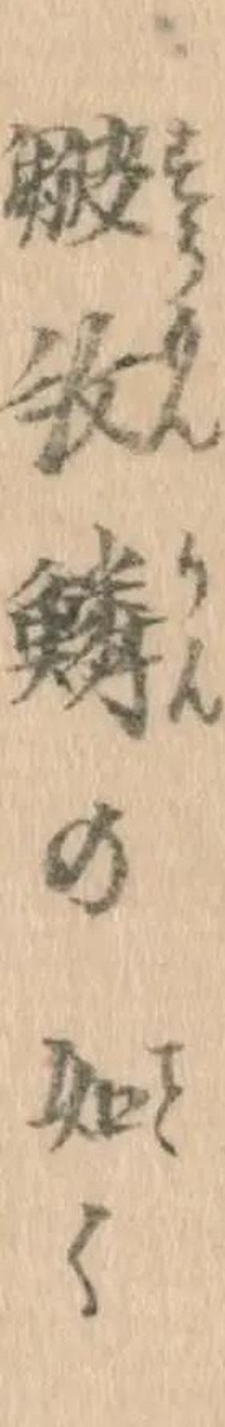皺紋鱗の如く
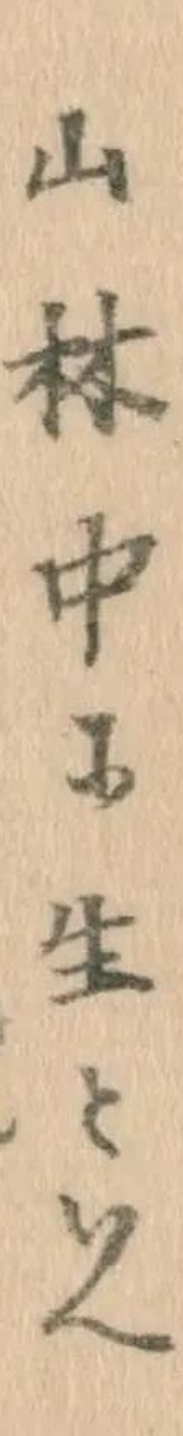山林中に生といへ
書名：本草図譜. 巻58-60
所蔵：国立国会図書館 National Diet Library, JAPAN
